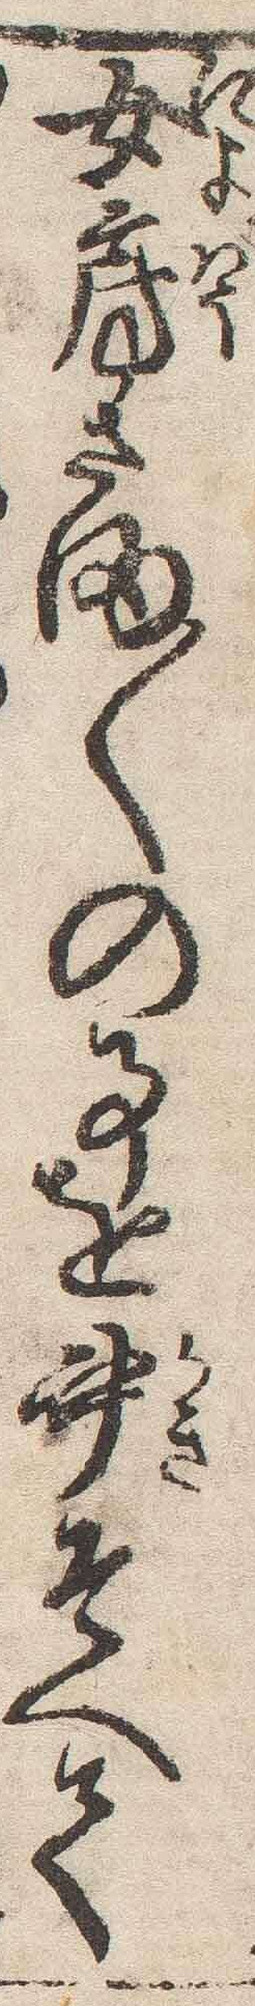女房さま〳〵の事を書そへて
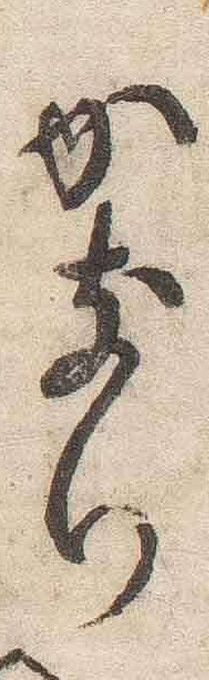かきり
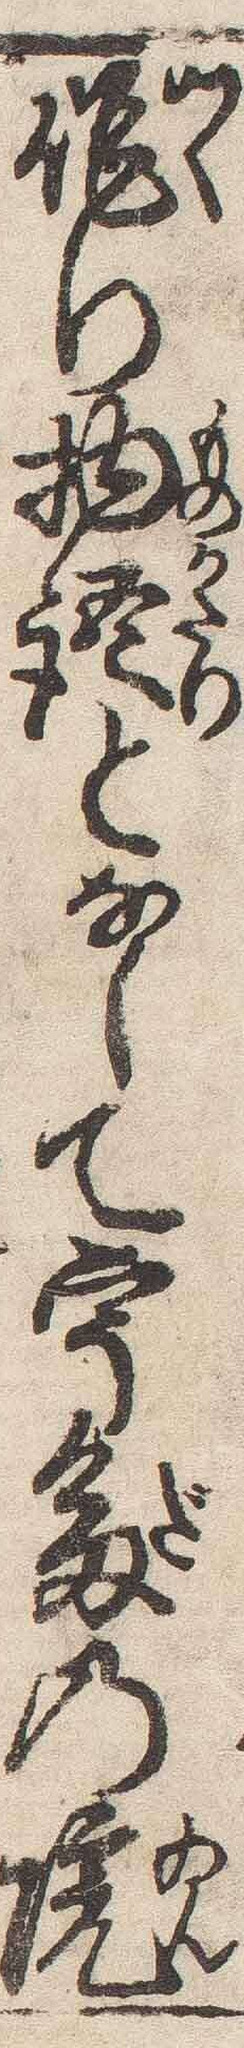作り物語となして宇多の院
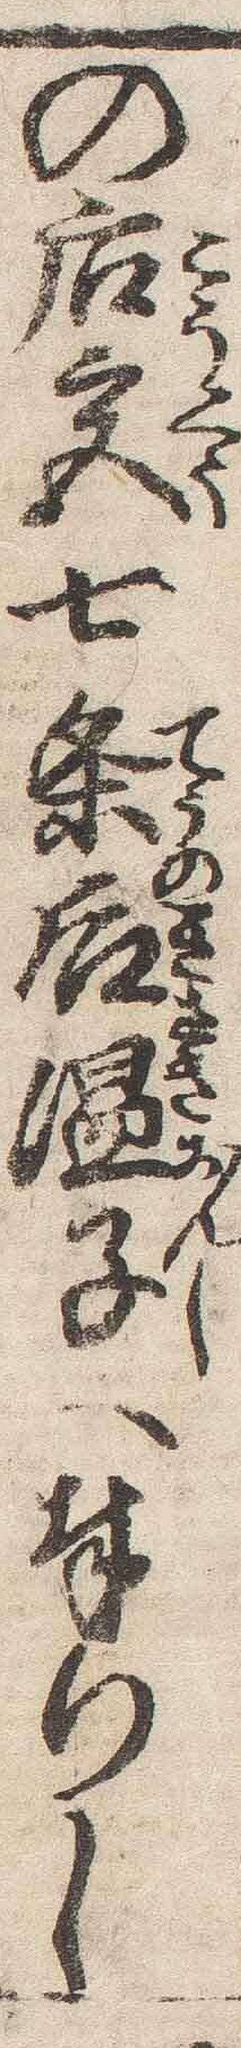の后宮七条后温子へ奉りし
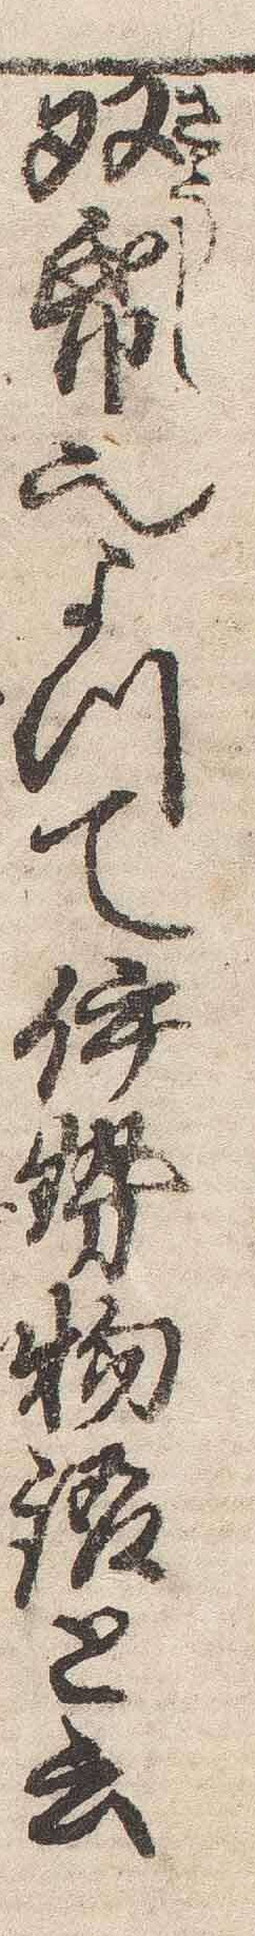双紙也よつて伊勢物語と云
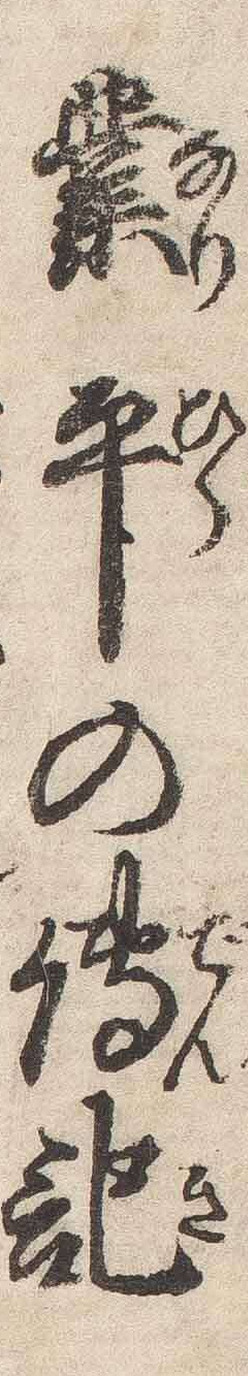業平の伝記
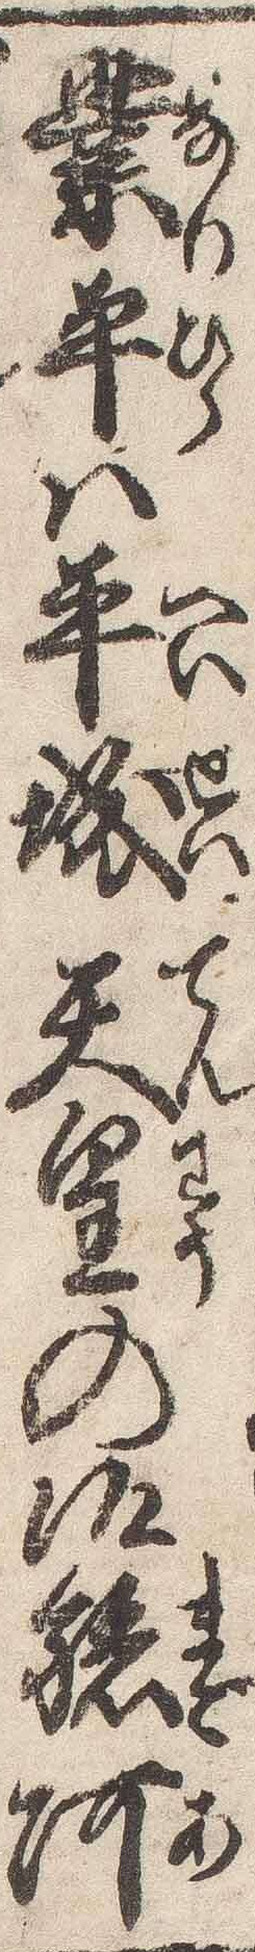業平は平城天皇の御孫阿
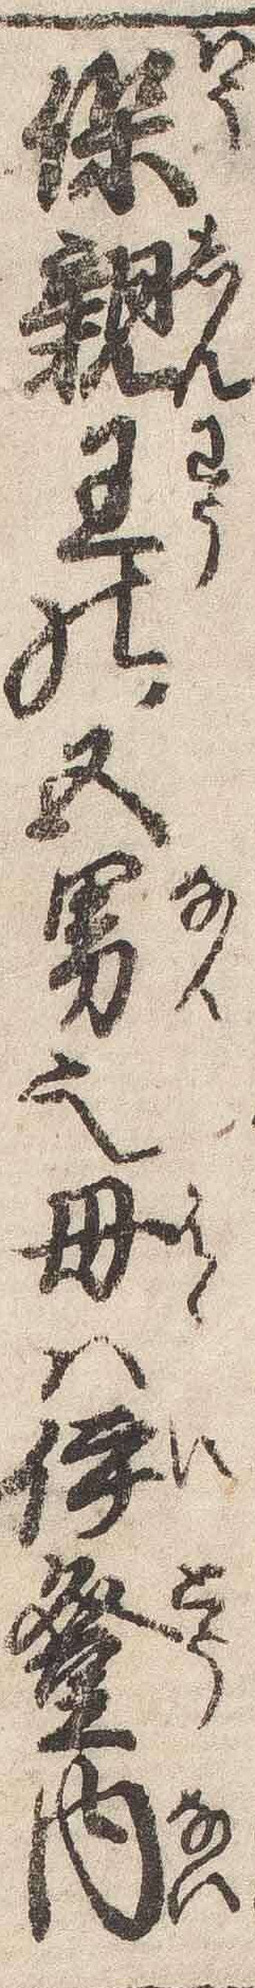保親王の五男也母は伊登内
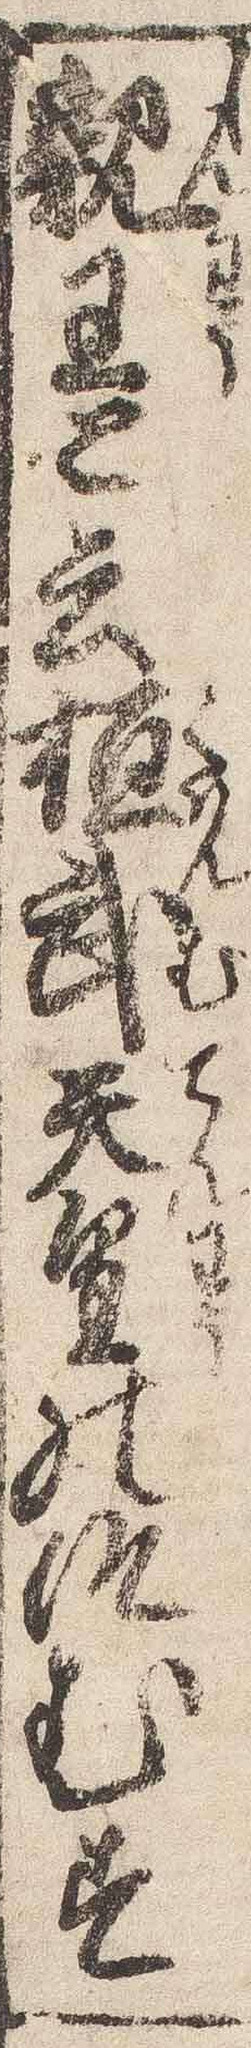親王と云桓武天皇の御むす
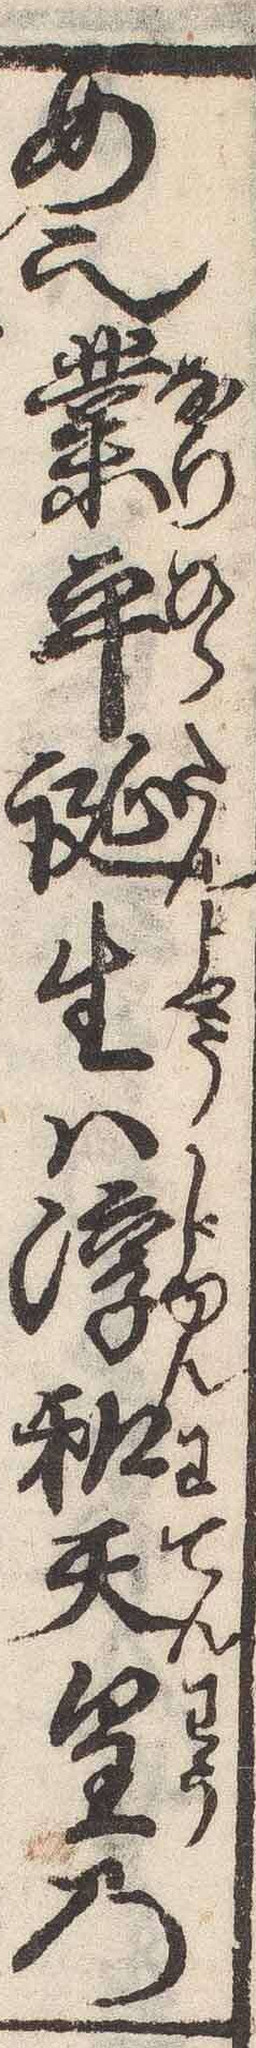め也業平誕生は淳和天皇の
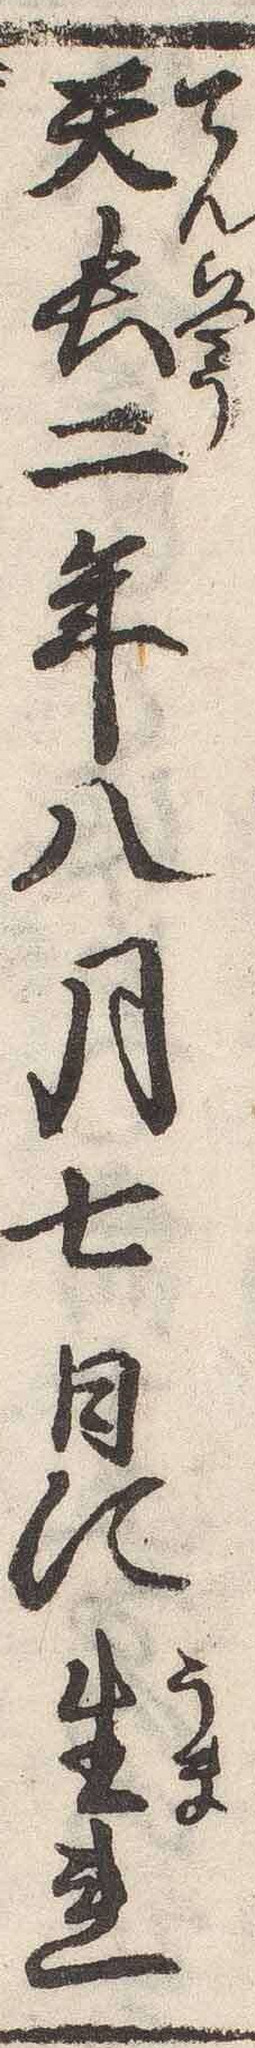天長二年八月七日に生れ
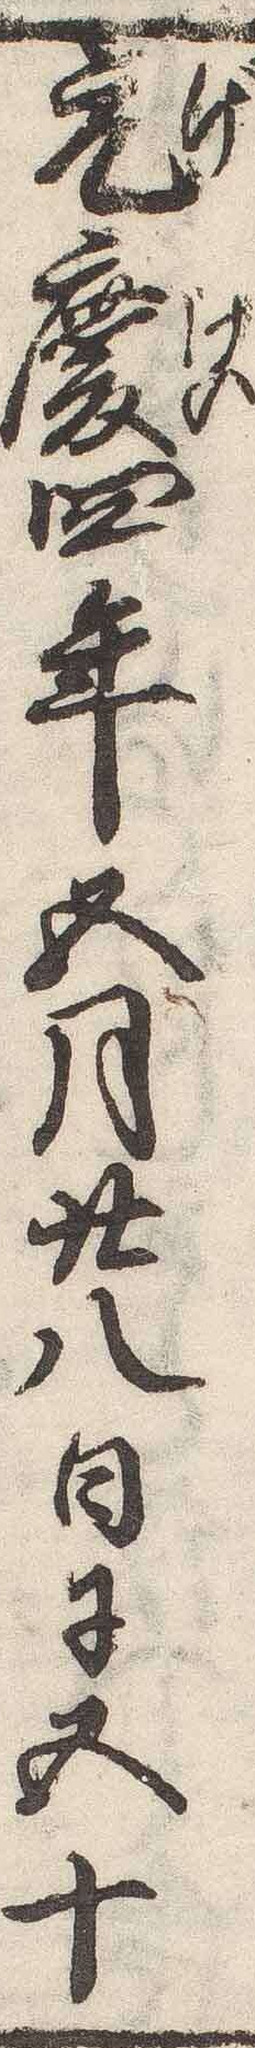元慶四年五月廿八日に五十
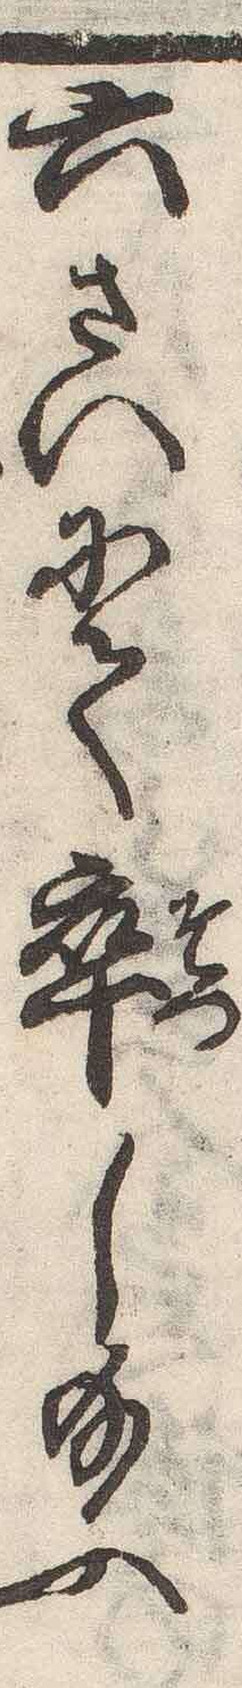六さいにて卒し給ふ
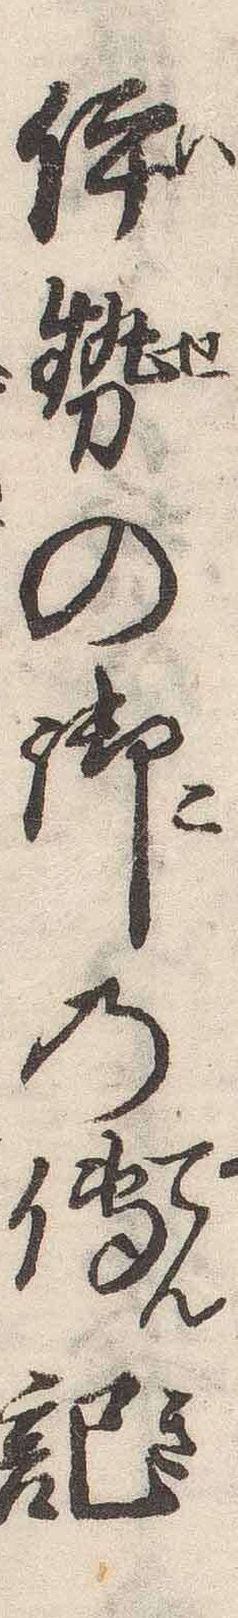伊勢の御の伝記
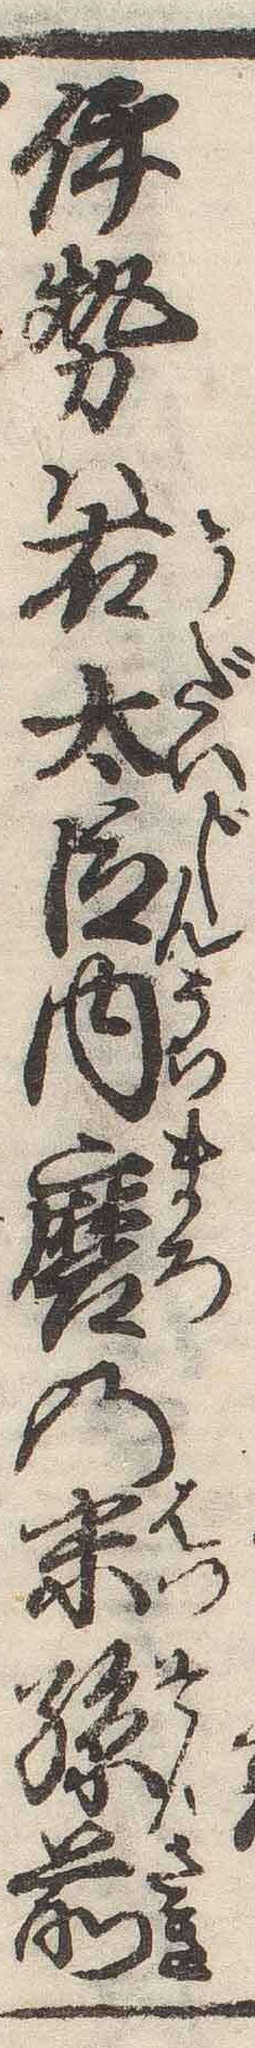伊勢は右大臣内麿の末孫前
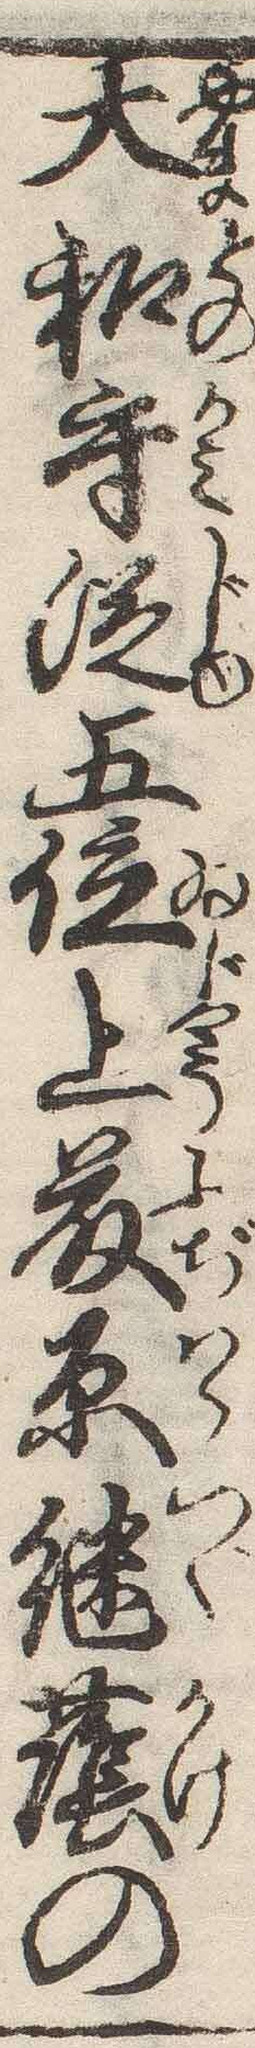大和守従五位上藤原継蔭の
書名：伊勢物語
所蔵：東京学芸大学附属図書館 国文学研究資料館
